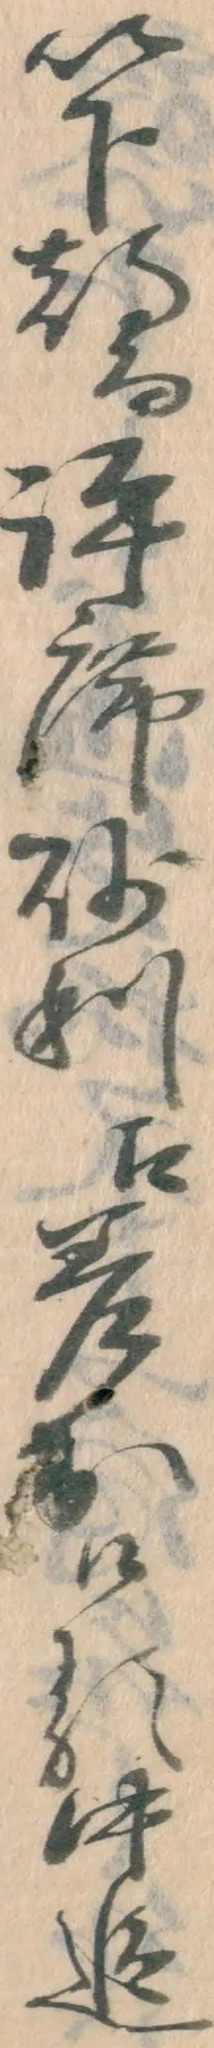以下都而評席砂利え差出候類中追

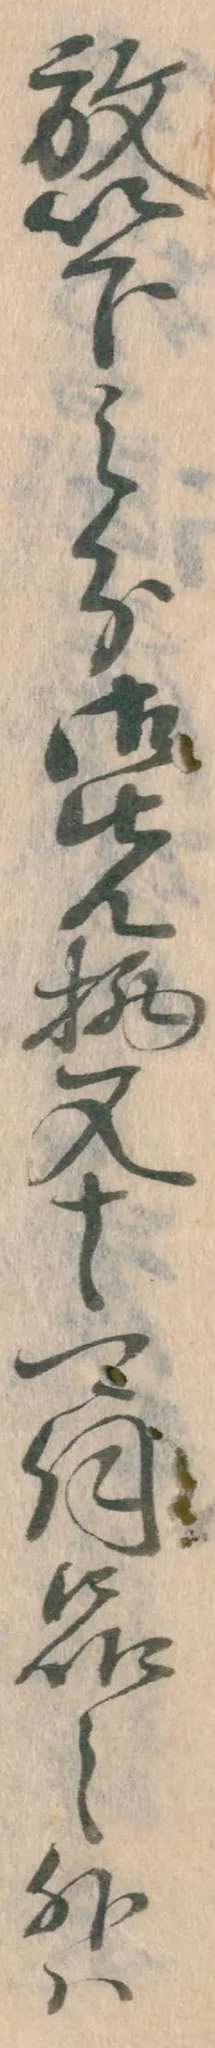放以下之分御先柄又は可伺品之外ハ
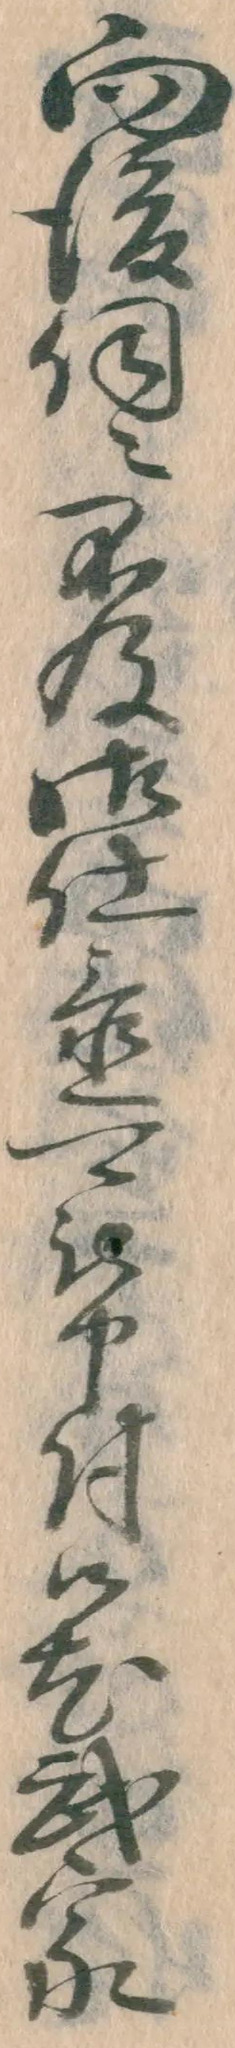向後伺ニ不及御仕置可被申付候尤武家
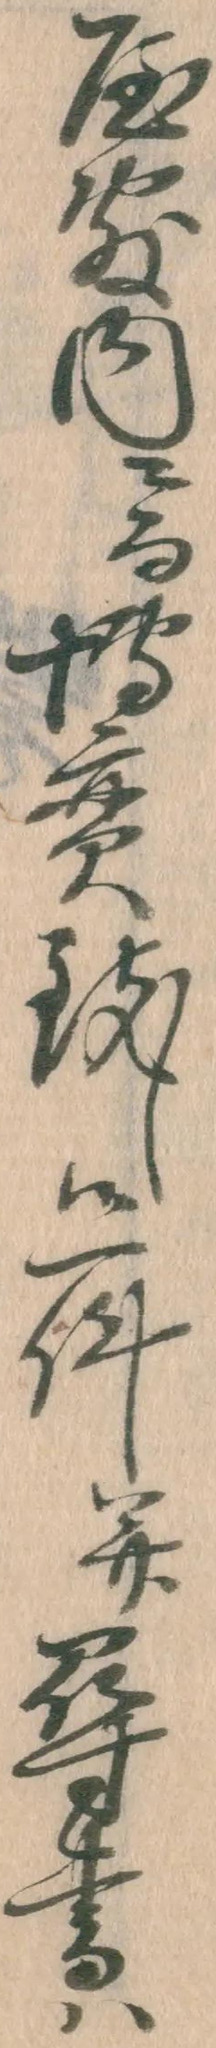屋敷内ニ而博奕致し候一件并尋書ハ
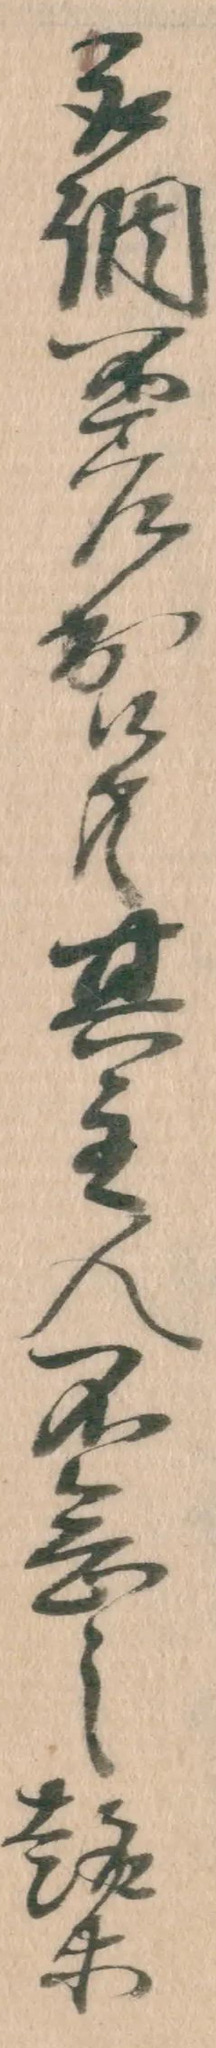取調不差出候共其主人不念之趣等
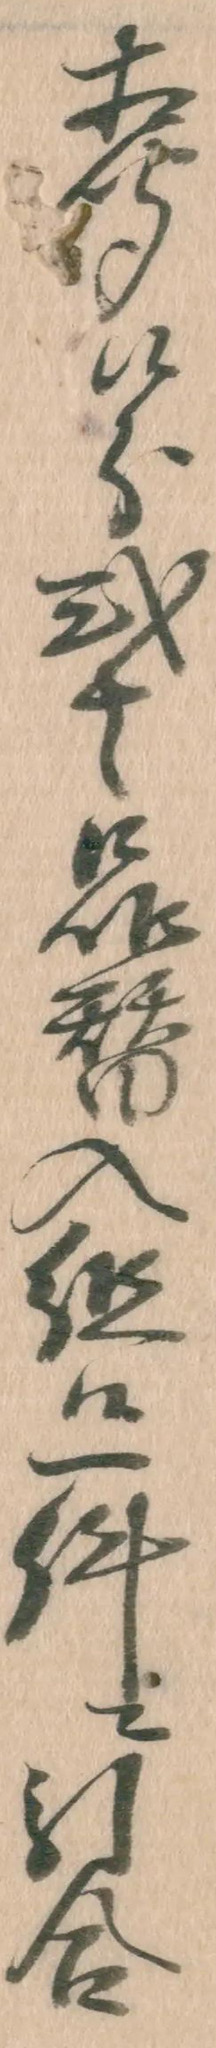相聞候分或は品替入組候一件ニ引合
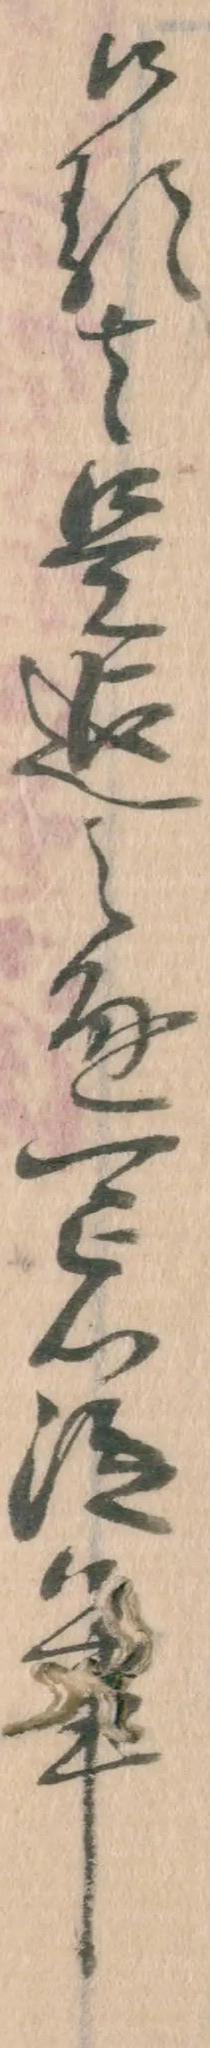候類は是迄之通可被心得候事
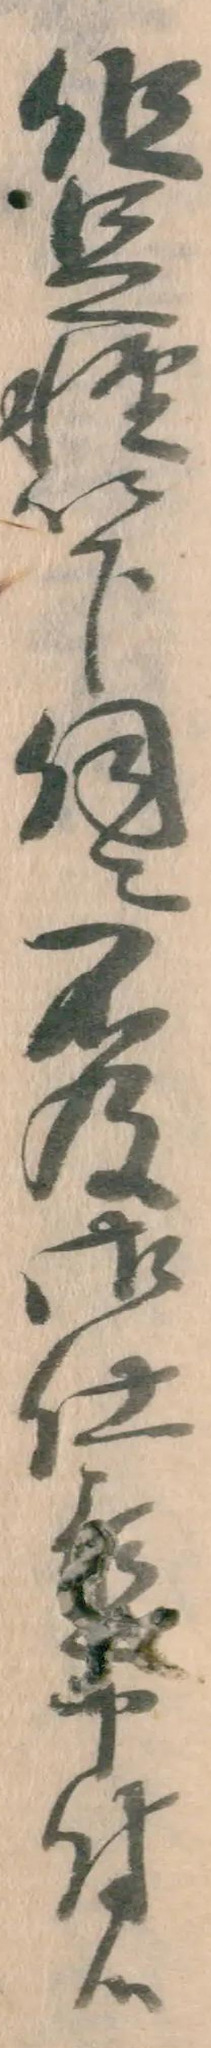但足軽以下伺ニ不及御仕置申付候
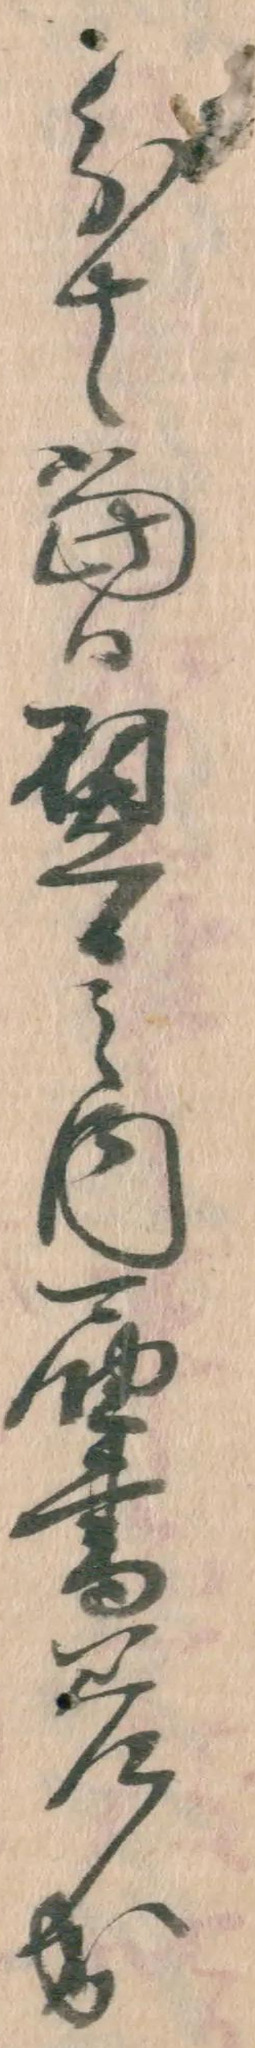分は当日翌日之内届書差出
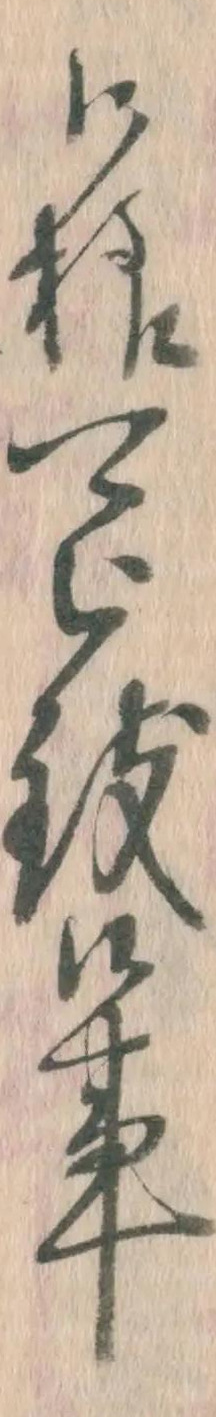候様可被致候事

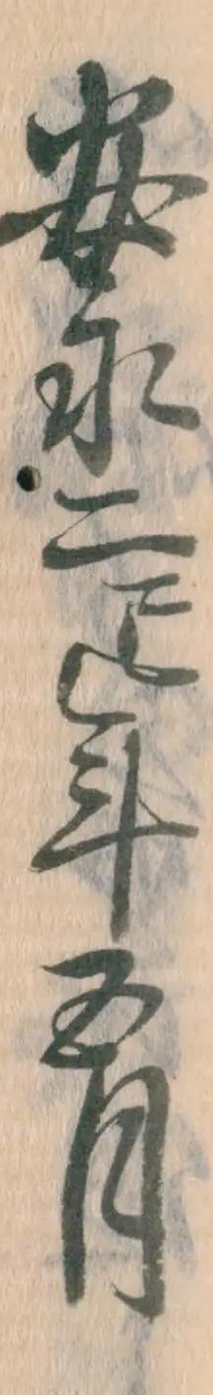安永二巳年五月

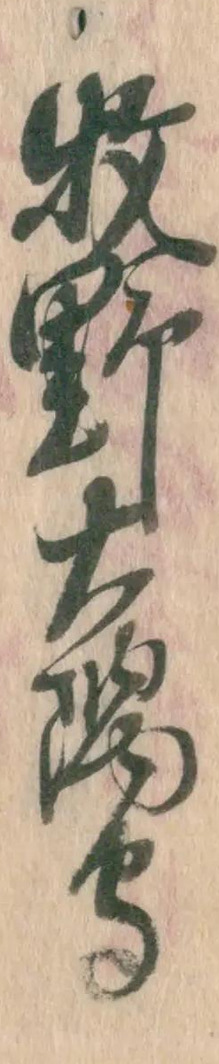牧野大隅守
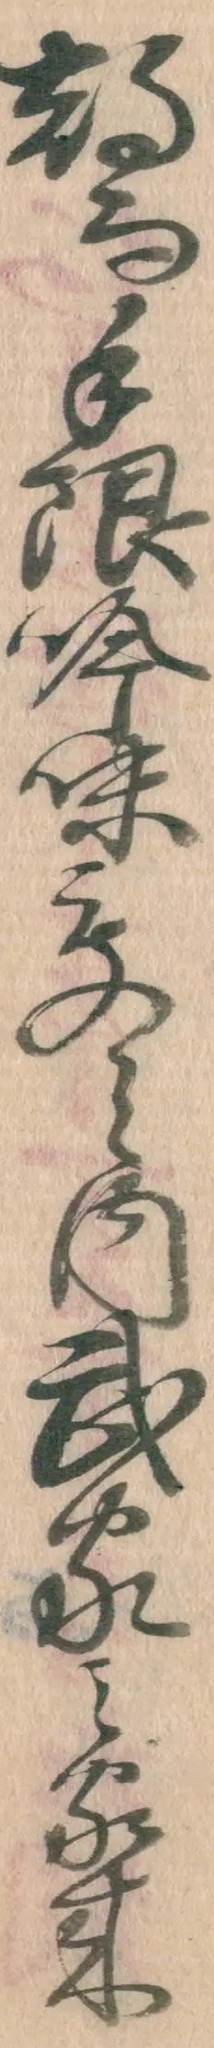都而手限吟味もの之内武家之家来
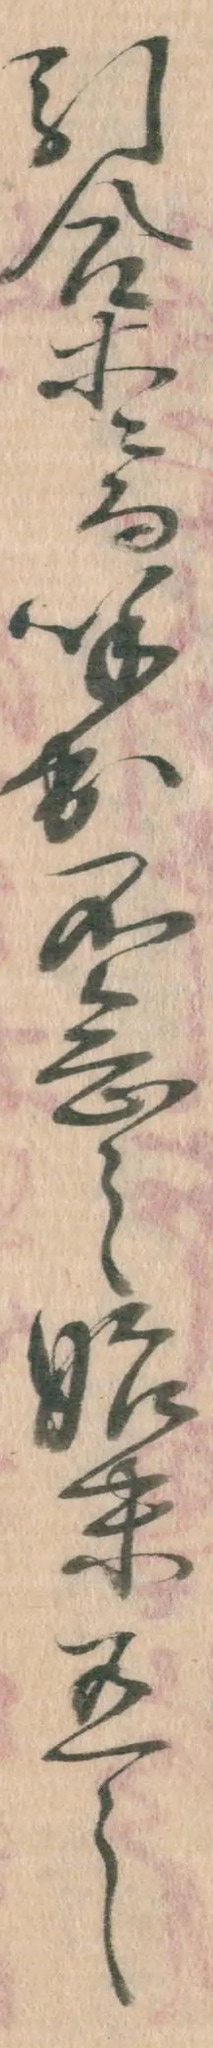引合等ニ而呼出不念之始末有之
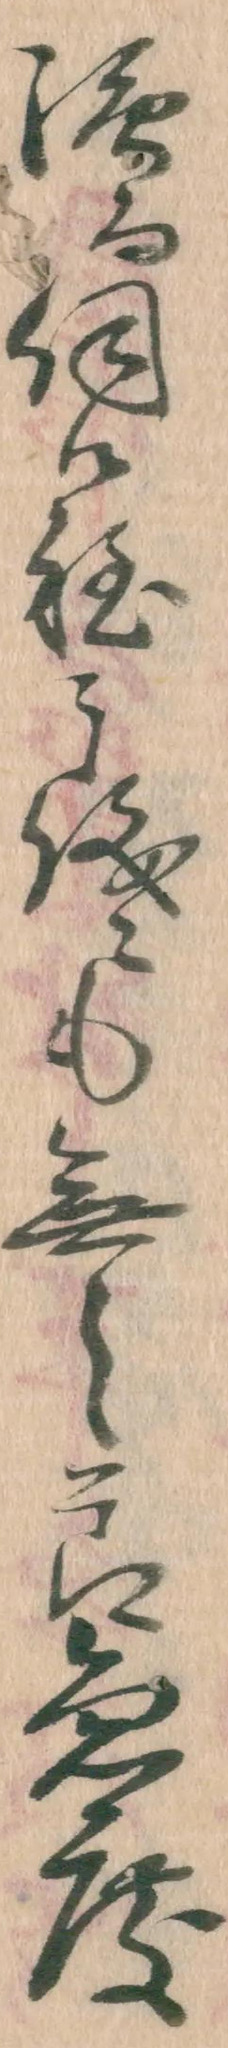強而伺候程之儀ニも無之節急度
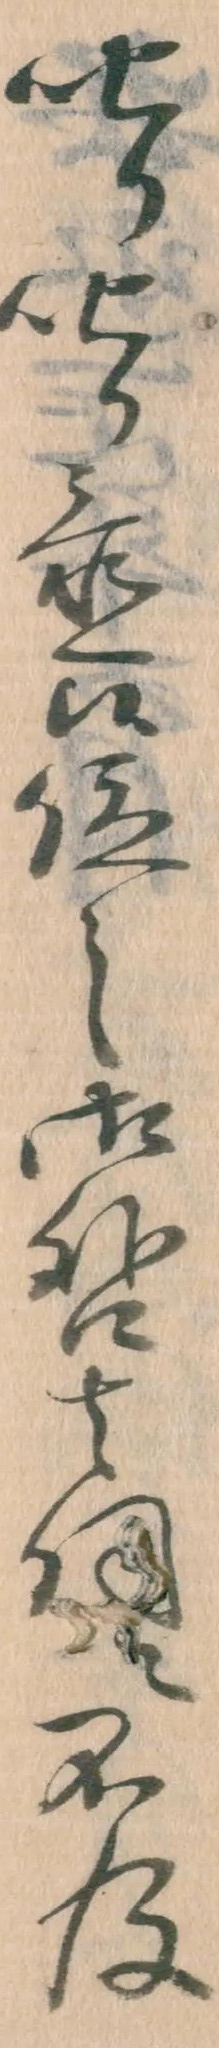叱り叱り置候位之御咎は伺ニ不及
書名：武家方并寺院等ニテ施差出候一件
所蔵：国立国会図書館 National Diet Library, JAPAN
